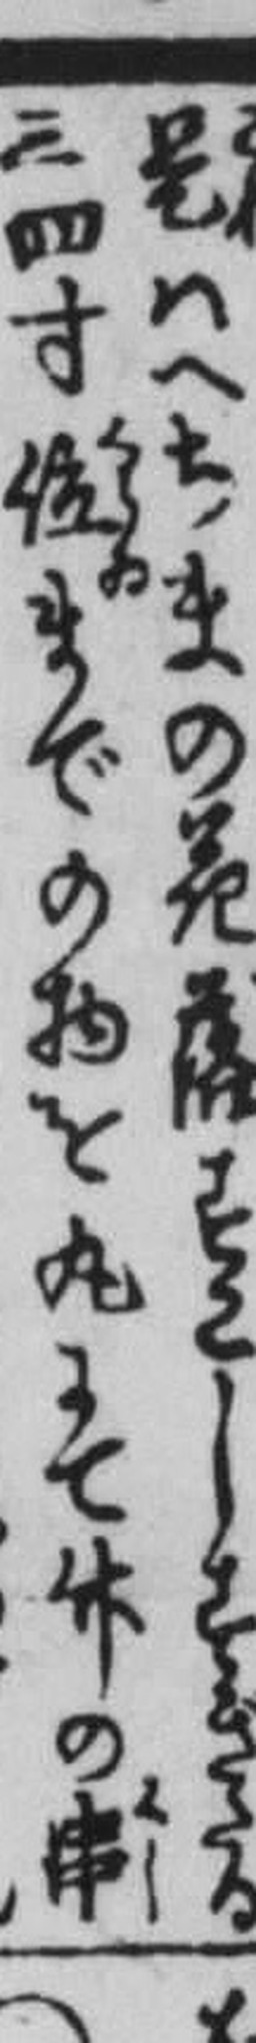三四寸位までの物を丸にて竹の串
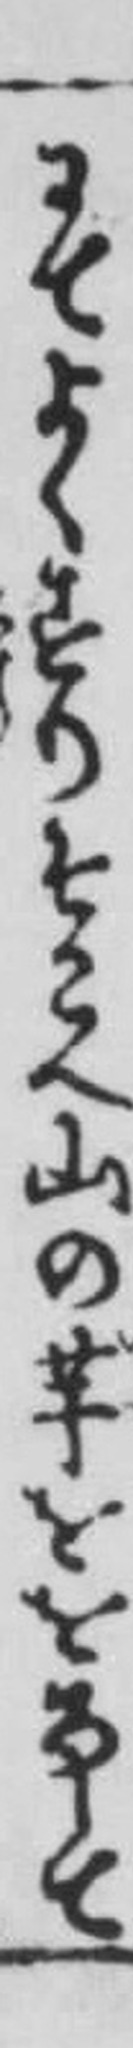にてよくすりそこへ山の芋ををろして
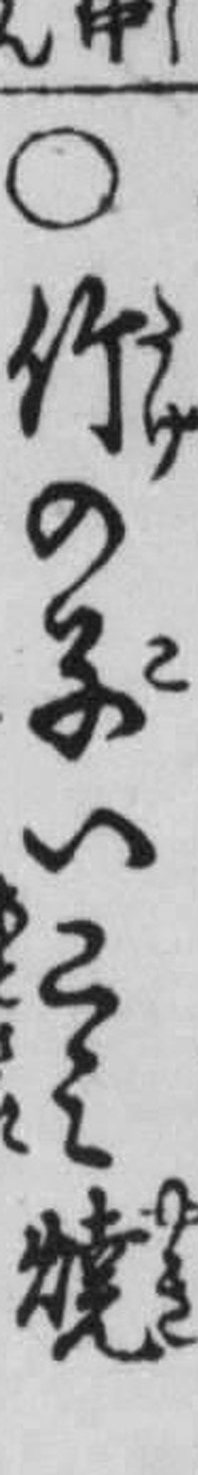〇竹の子いこみ焼
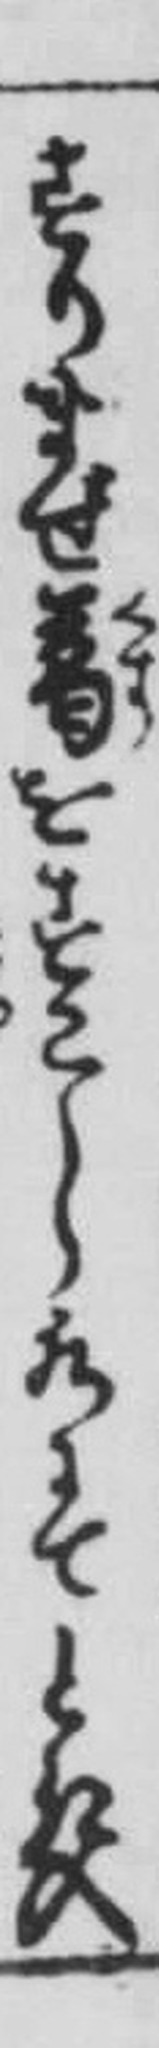すりまぜ葛をすこし水にてとき入
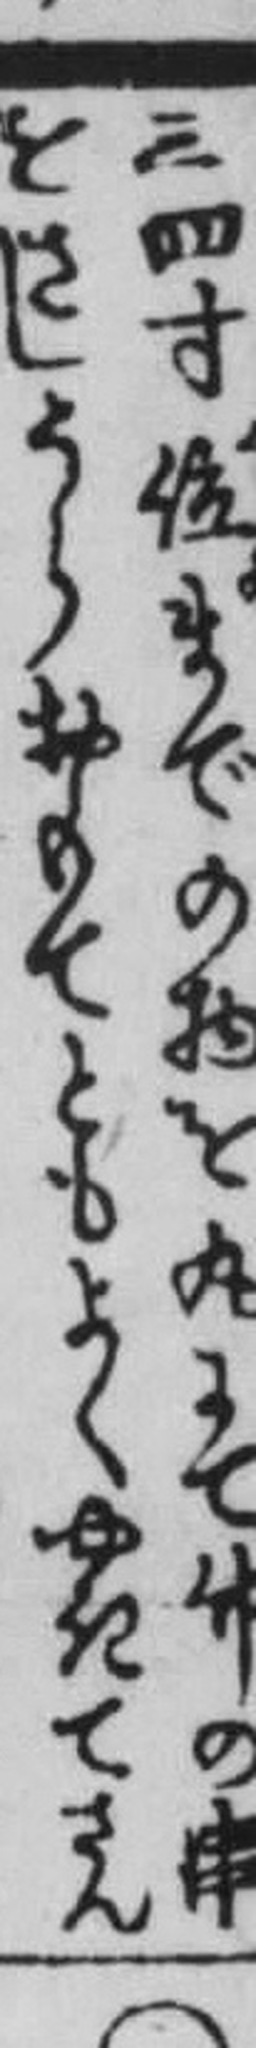をさしうらおもてともよくやきてさん
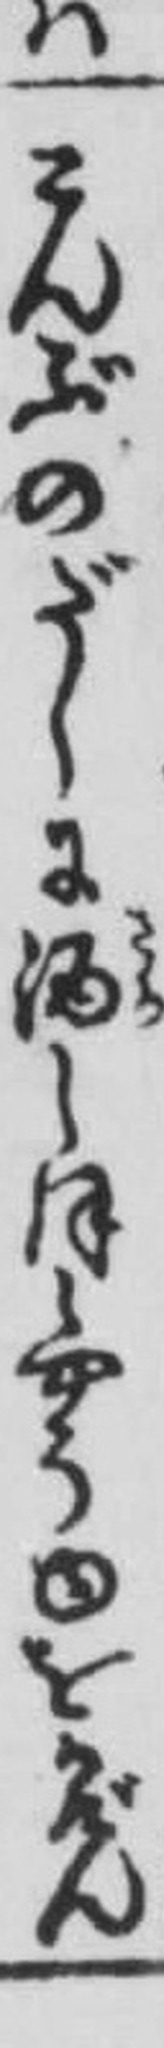こんぶのだしに酒しほしやうゆをかげん
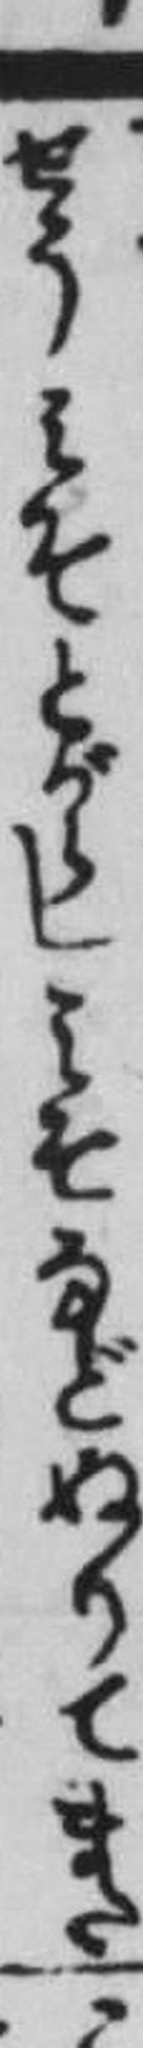せうみそとがらしみそなどぬりてまた
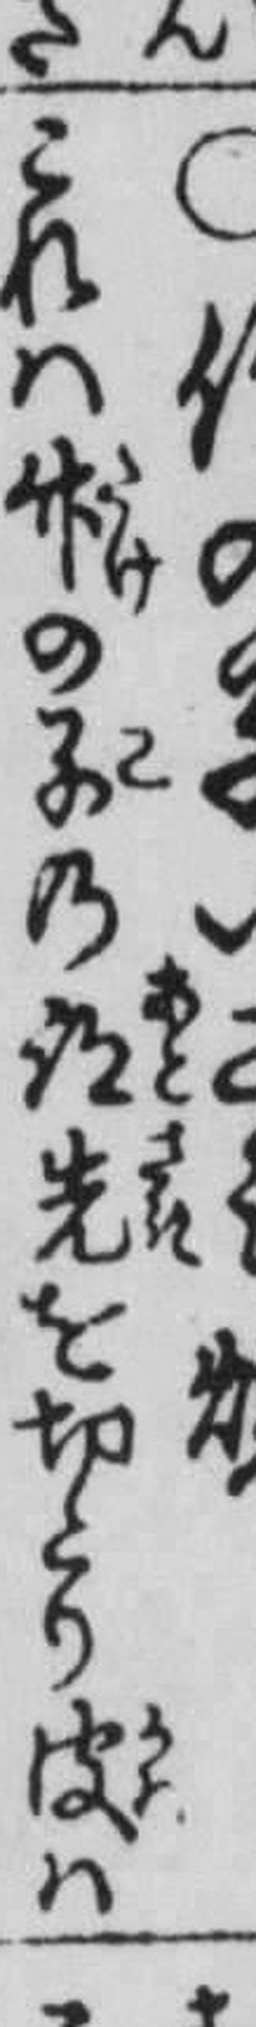これは竹の子の後先を切とり皮は
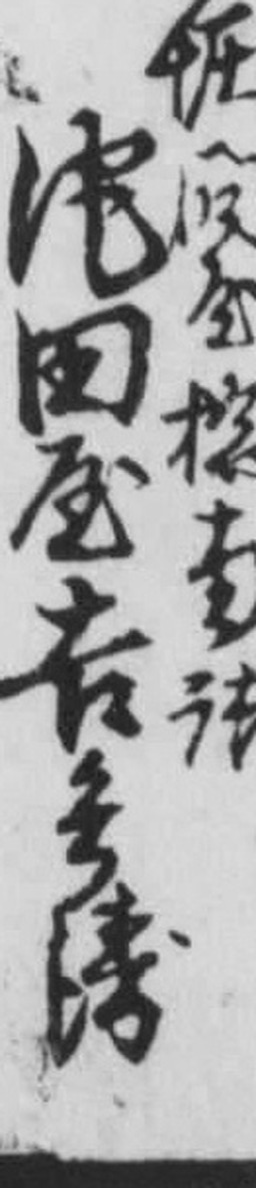池田屋吉兵衛
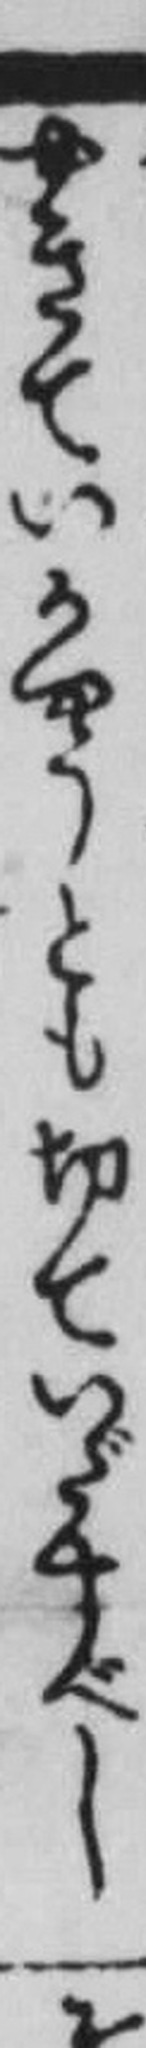やきていかやうとも切ていだすべし
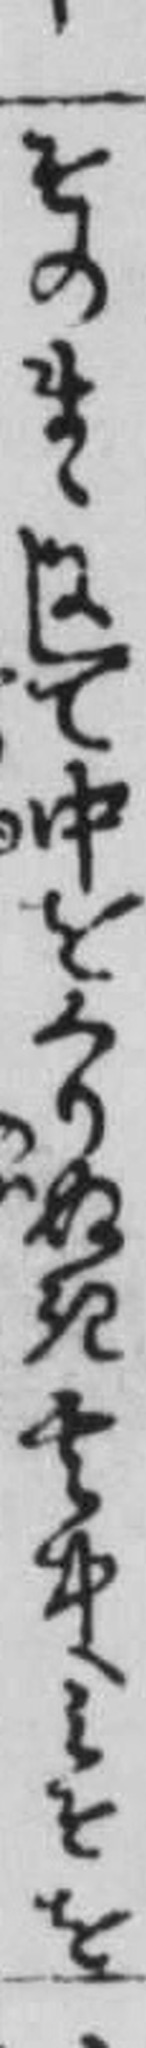そのままにして中をくりぬき其中へみそを
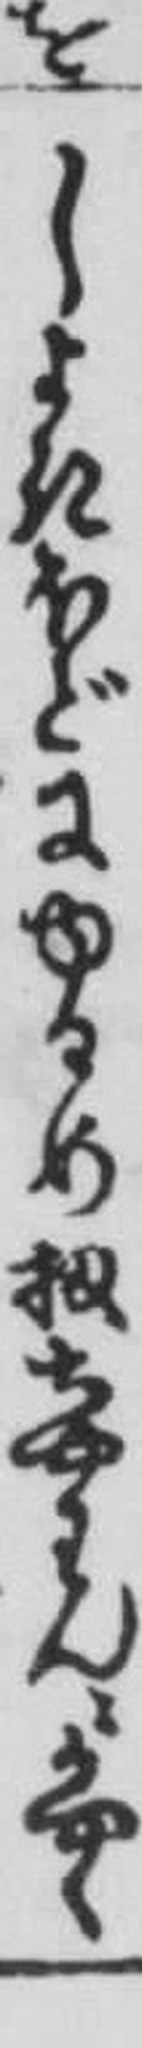しよきほどにゆるめ扨ちやわんにかやく
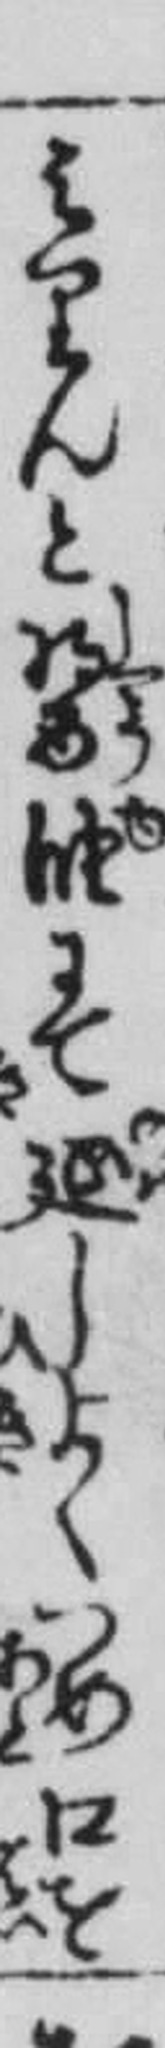みりんと醬油にて延しよくつめ口を
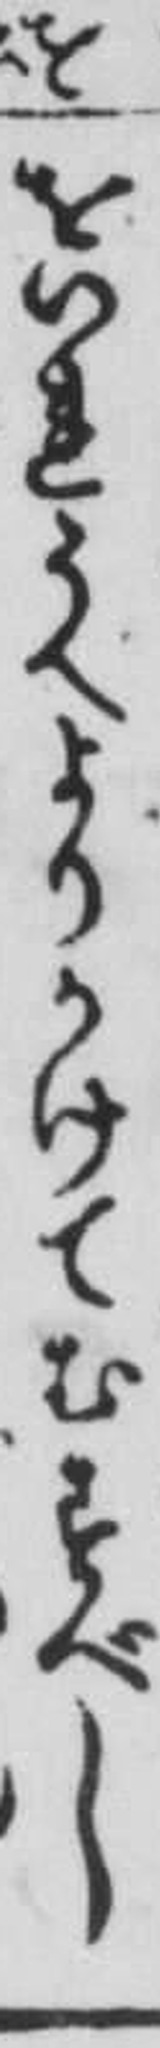をいれうへよりかけてむすべし
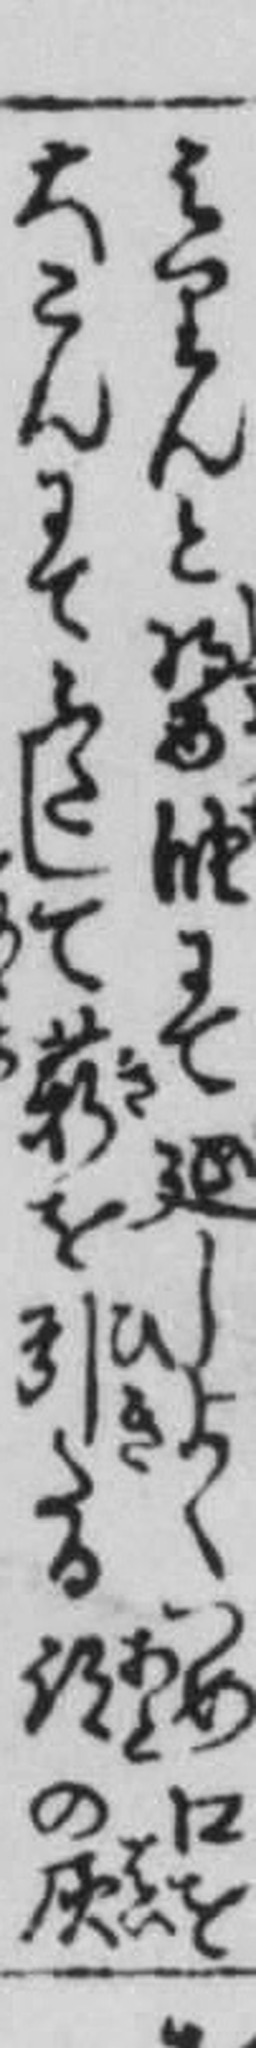大こんにてふたして薪を引たる後の灰
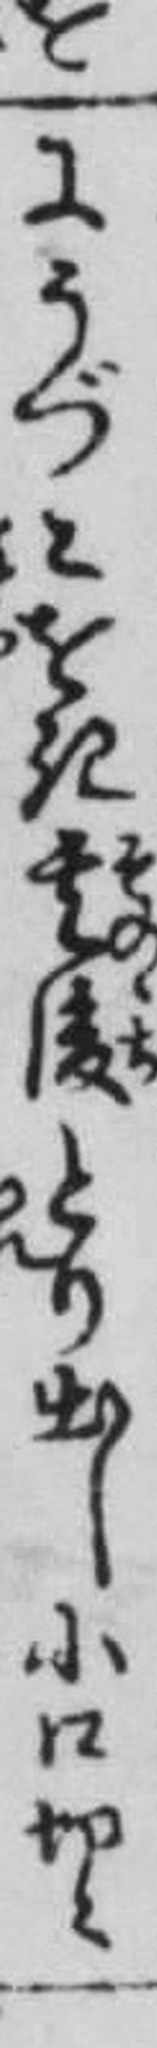にうづとをき其後とり出し小口切に
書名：日用重宝魚類精進/料理早工風
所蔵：大阪府立大学学術情報センター 国文学研究資料館
